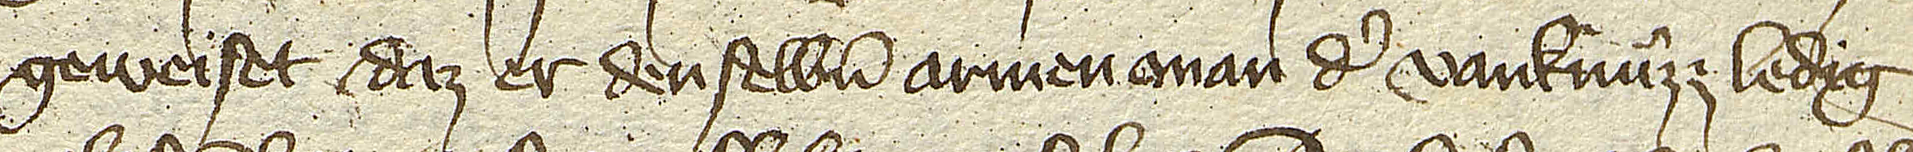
geweiſet / daʒ er denſelbn* armen man d* vanknüʒʒ ledig
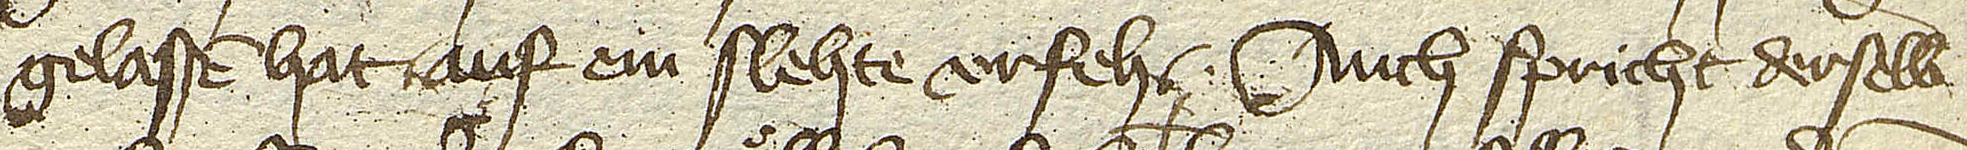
gelaſſe* hat / auf ein ſlehte vrfeh / . Auch ſpricht derſelb
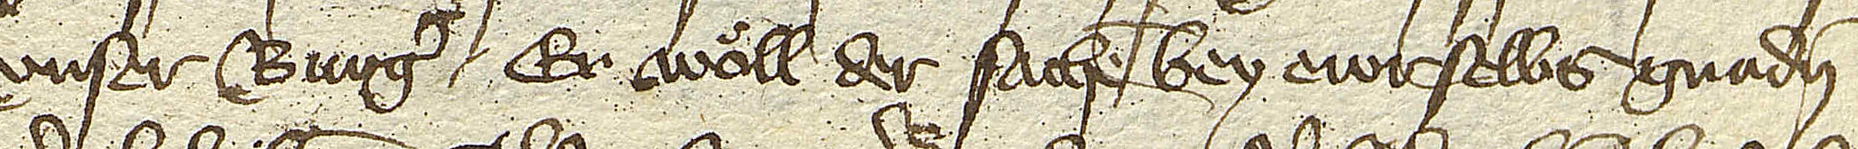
vnſer Burg* / Er wöll der ſache bey ewr ſelbs gnadn*
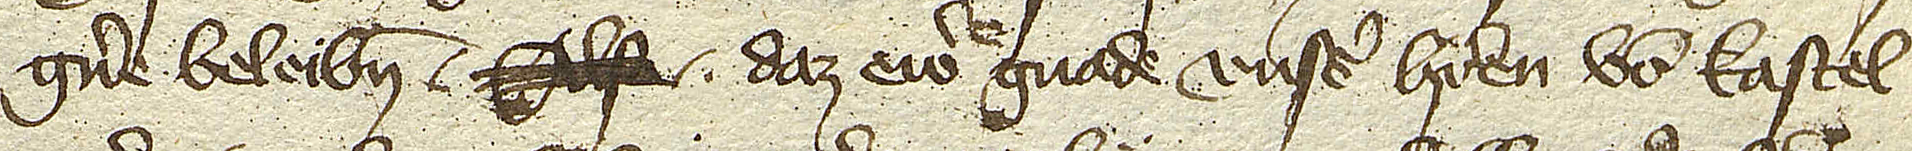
gn*e beleibn* / Alſo / . daʒ ew* gnade vnſs* hr*en vo* kaſtel
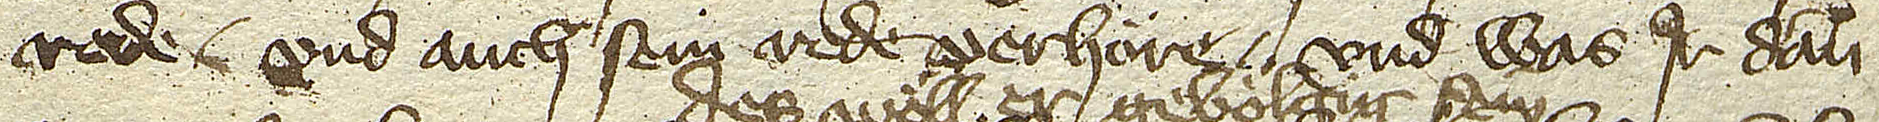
rede / vnd auch ſein rede verhöre / . vnd was Ir dan*
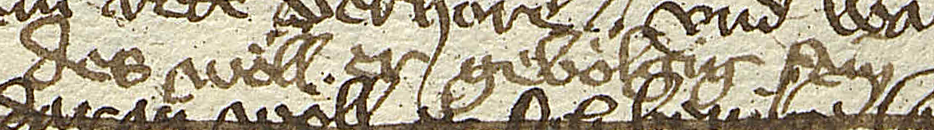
des wöll er gevölgig ſein
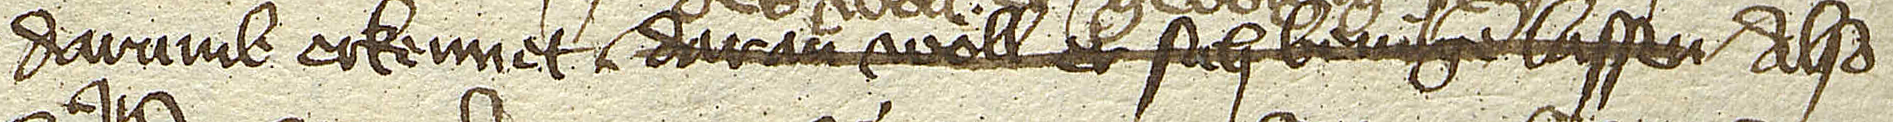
darumb erkennet / daran wöll er ſich benüge* laſſen / Alſo
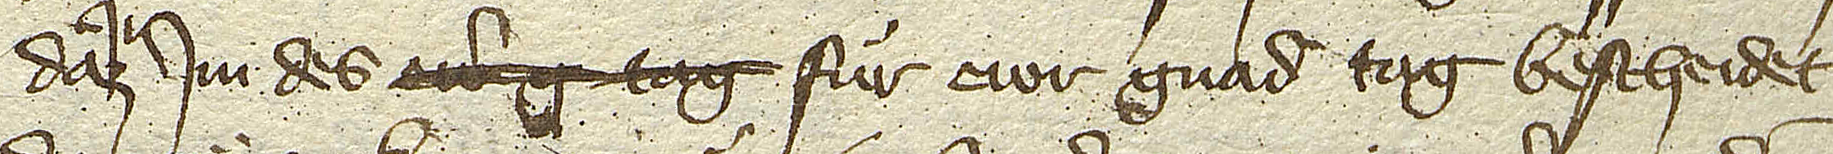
daʒ Im des ew* g tag für ewr gnad tag beſcheidet
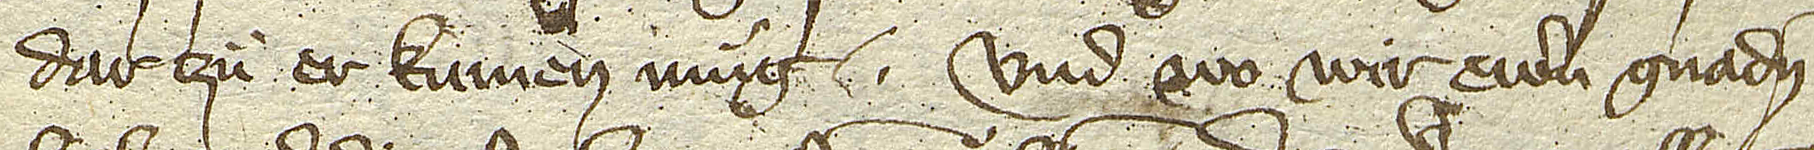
dar cʒü er kumen müg / . vnd wo wir ew*n gnadn*
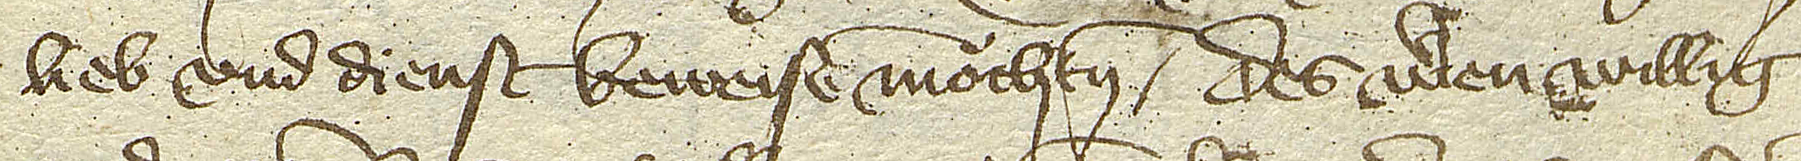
lieb vnd dienſt beweiſe* möchtn* / Des w*en willig
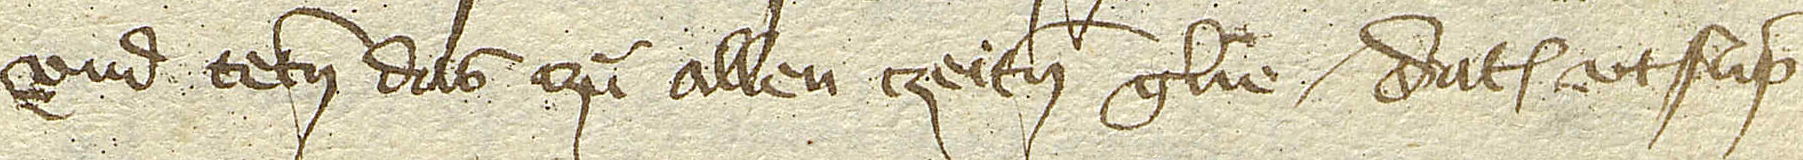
vnd tetn* das cʒü allen cʒeitn* g*ne / Dat* vt ſup*
